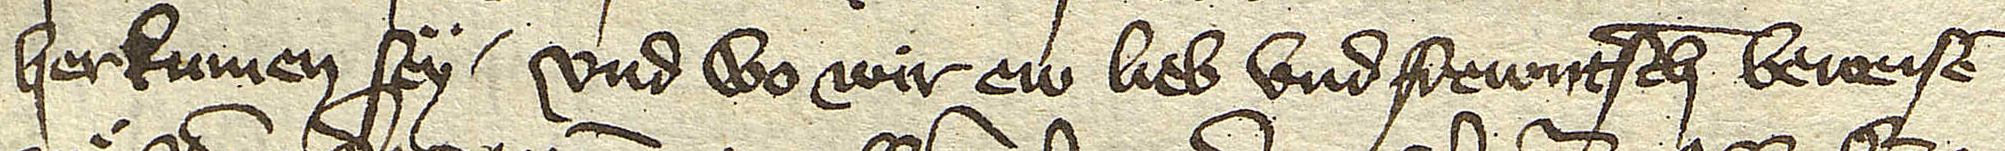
herkumen ſey / vnd wo wor ew lieb vnd frewntſch* beweiſe*
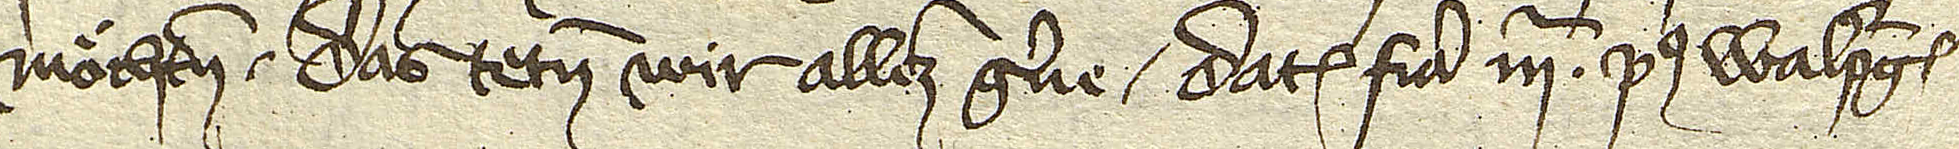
möchtn* / Das tetn* wir allcʒ g*ne / Dat* fia* iii* . p* Walp*g*
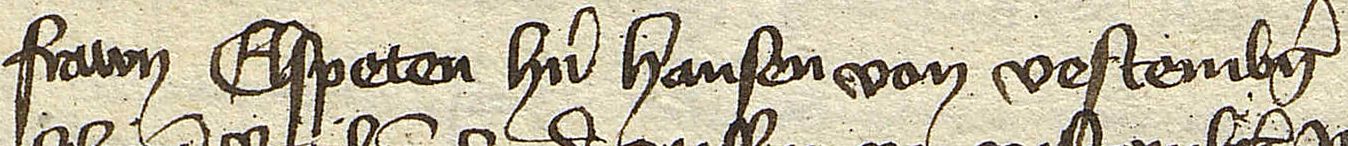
frawn Elſpeten hn* hanſen von veſtembg*
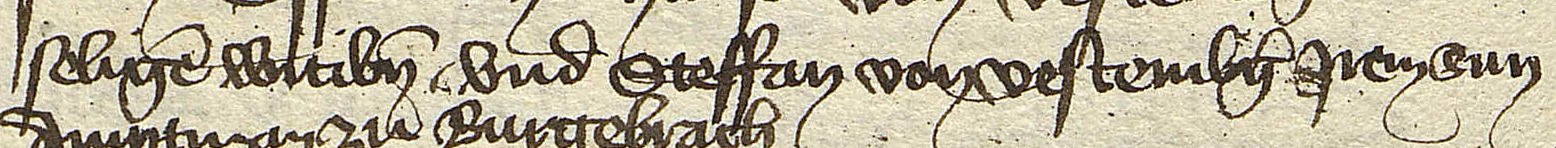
ſelige* witibn* / vnd Steffan von veſtembg* Irem Sun
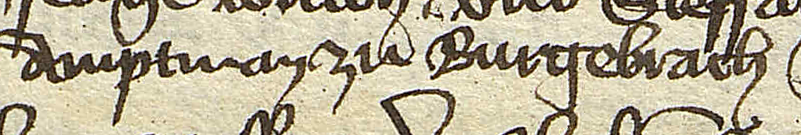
Amptman cʒu Burgebrach
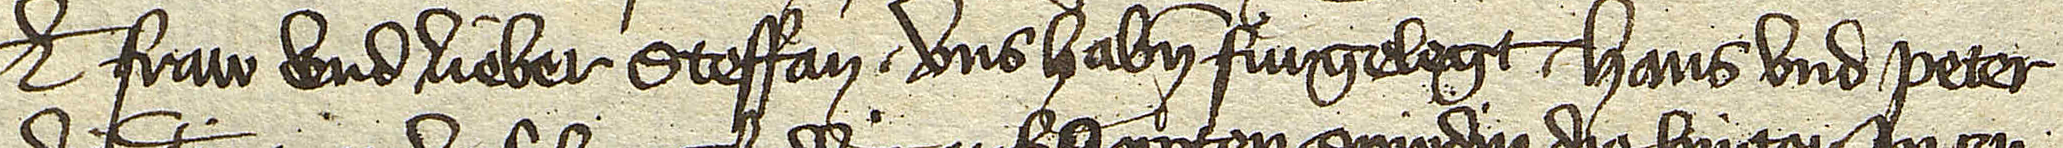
L* fraw vnd lieber Steffan / Vns habn* fürgelegt / hans vnd Peter
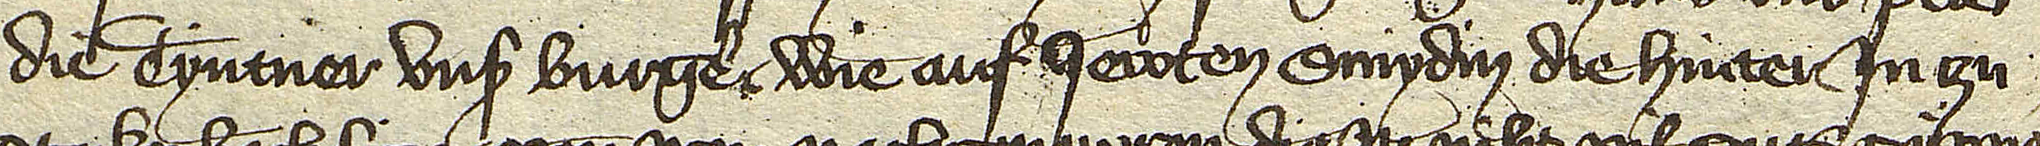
die Tyntner vnſ* burge* / wie auf Iewten Smydin die hinter In cʒu
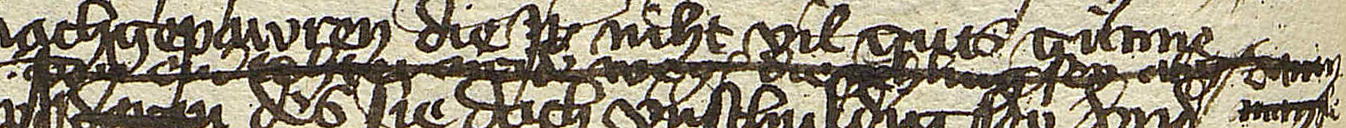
von ein* tohter meyd weg* die gehling ſey abg* daran
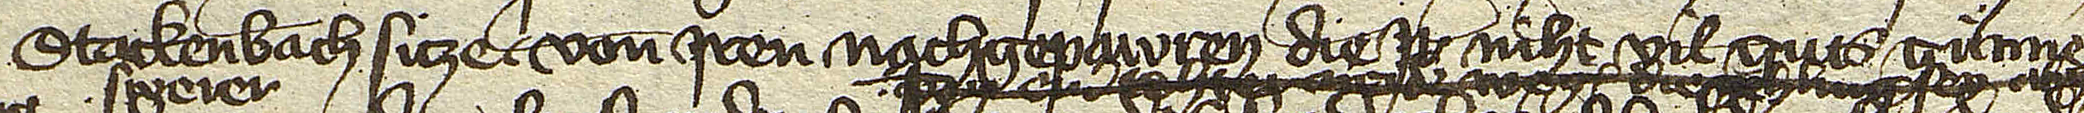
Stackenbach ſicʒe / von Iren nachgepawren die Ir niht vil guts günne*
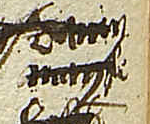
man ſie
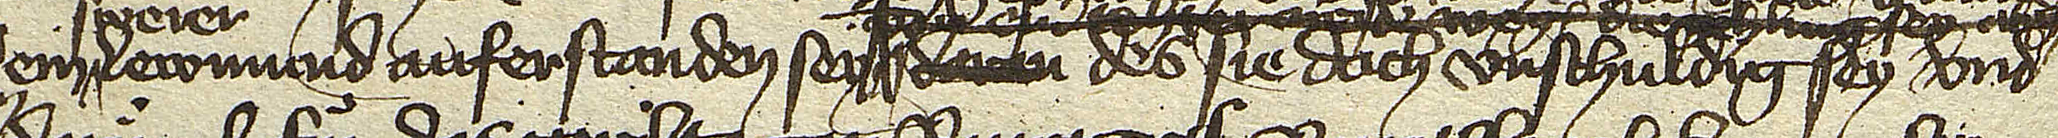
ein lewmund auferſtanden ſey daran des ſie doch vnſchuldig ſey / vnd
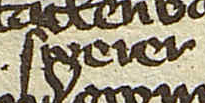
ſwerer
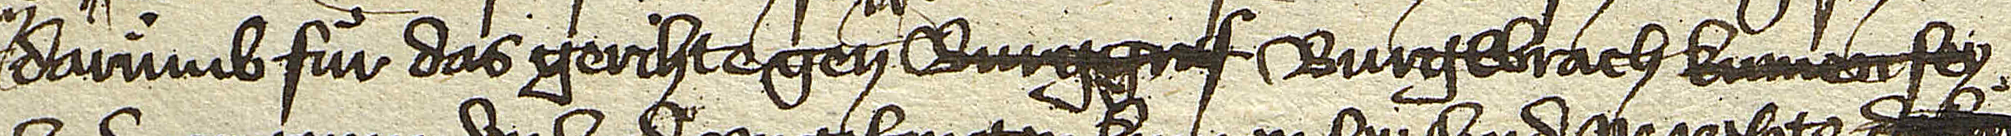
darümb für das gerihte gen Burggraf Burgebrach kumen ſey
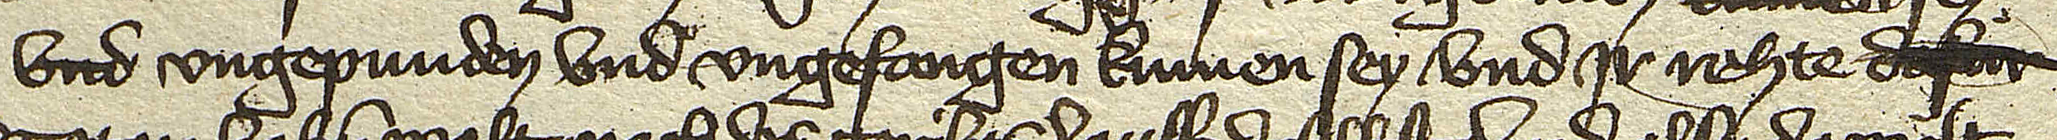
vnd vngepunden vnd vngefangen kumen ſey / vnd Ir rehte dafür
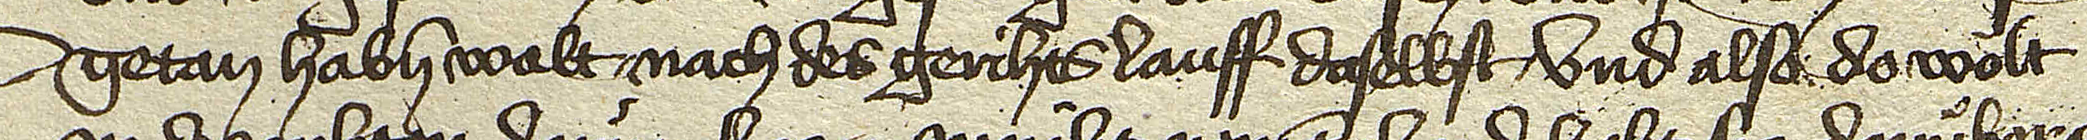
getan habn* wolt / nach des gerihts lauff daſelbſt / vnd alſo do wölt
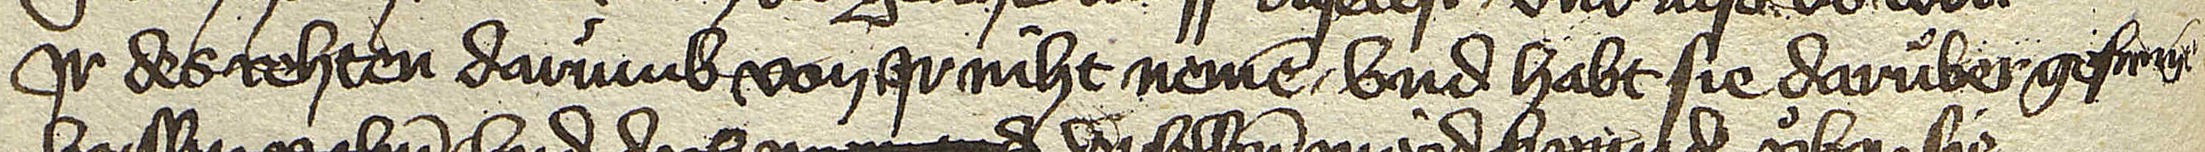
Ir des rehten darümb von Ir niht neme* / vnd habt ſie darüber gefange*
